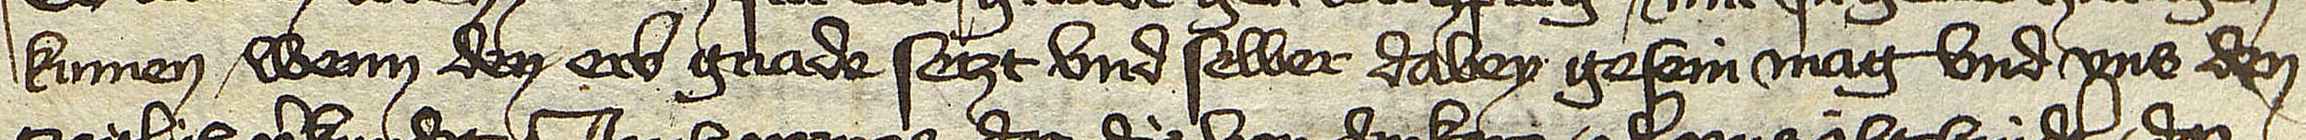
kumen / wenn den ew* gnade ſecʒt vnd ſelber dabey geſein mag vnd vns den
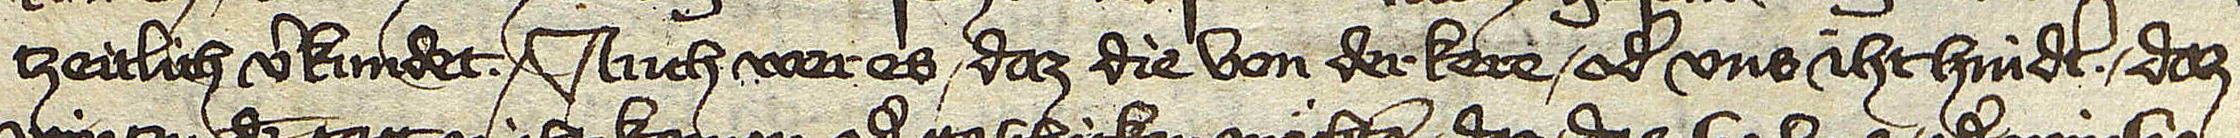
cʒeitlich v*kundet / . Auch wer es / daʒ die von der kere / od* vns iht hindt* . / daʒ
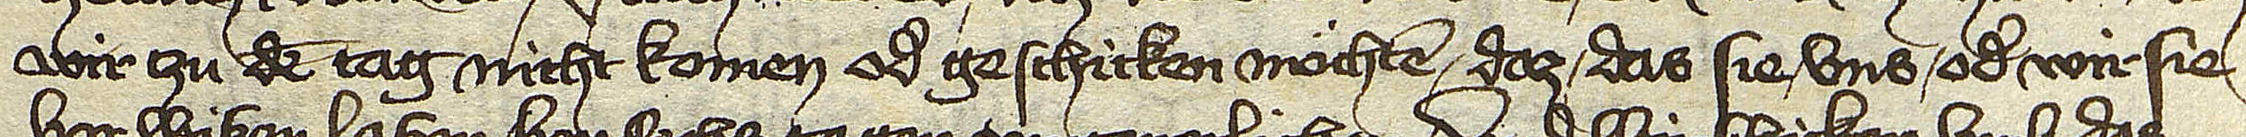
wir cʒu de* tag nicht komen od* geſchicken möchte* / daʒ / das ſie / vns / od* wir ſie
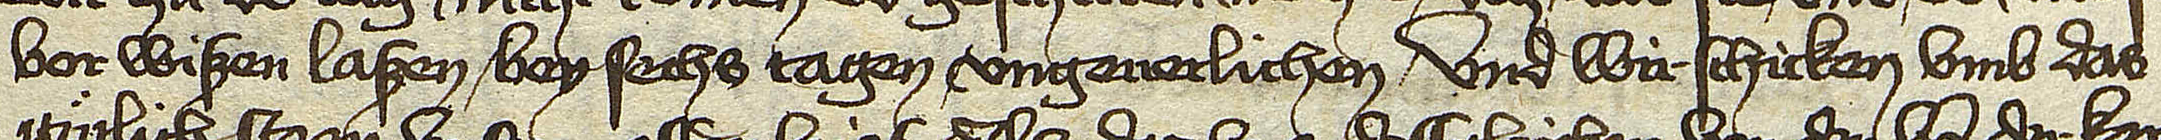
vor wiſʒen laſʒen / bey ſechs tagen vngeuerlichen / vnd wir ſchicken vmb das
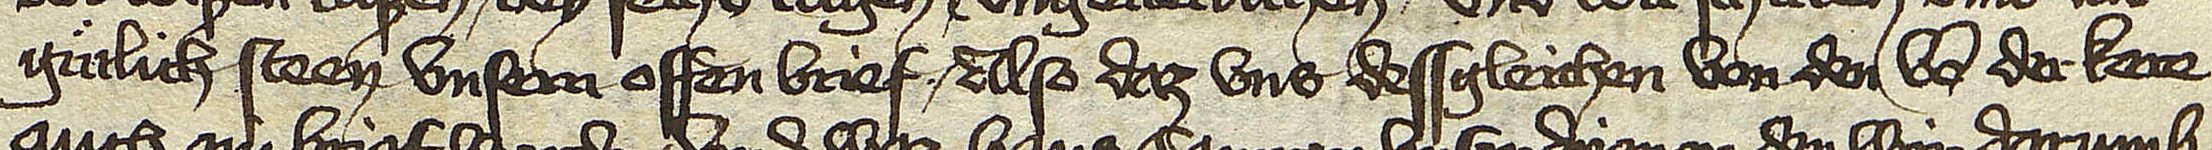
gütlich ſteen vnſern offen brief / Alſo daʒ vns deſſgleichen von den vo* der kere
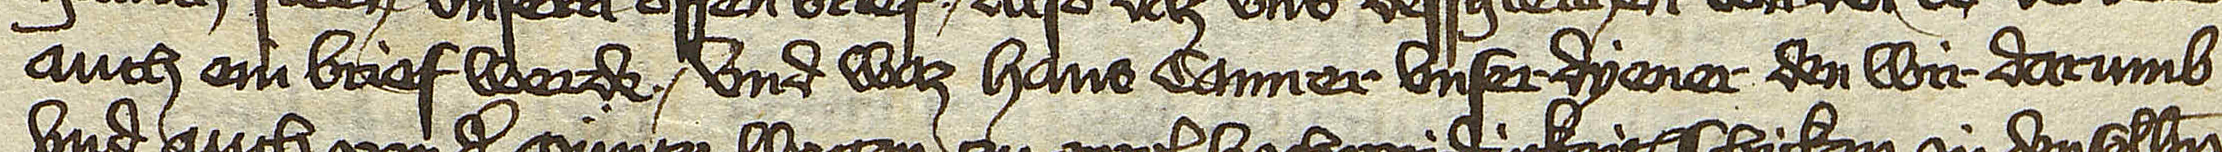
auch ein brief werde / vnd waʒ hans Camrer vnſer dyener den wir darumb
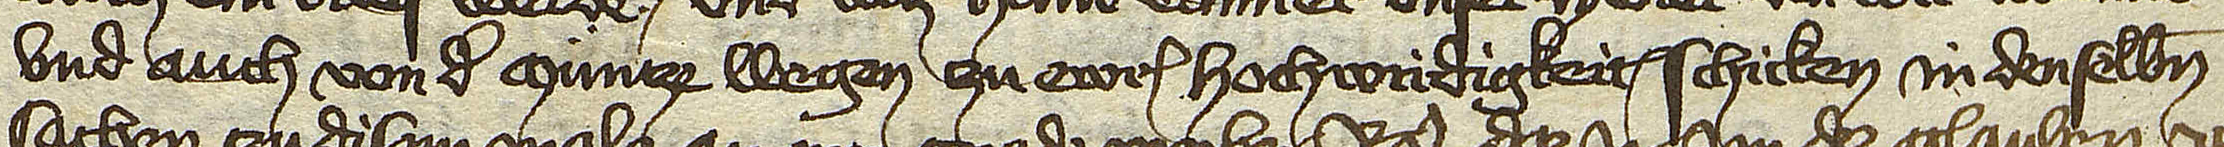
vnd auch von d* Müncʒe wegen cʒu ewr* hochwirdkeit* ſchicken in denſelbn*
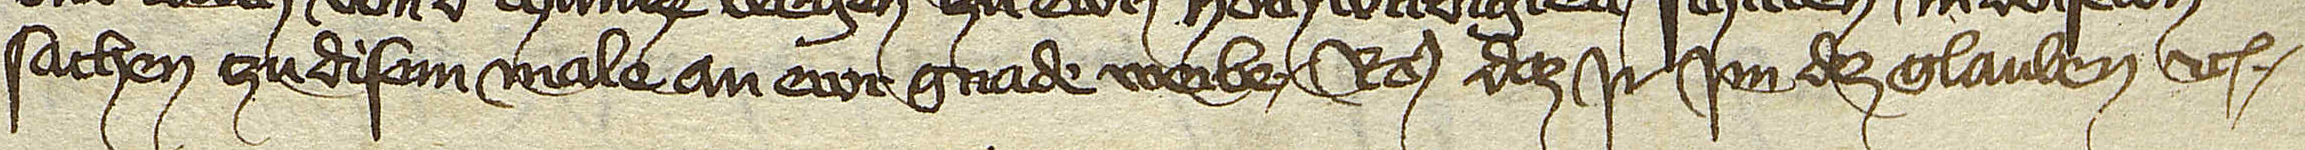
ſachen cʒu diſem male an ewr gnade werbe / Ro* daʒ Ir Im deʒ gelauben ec* . /
